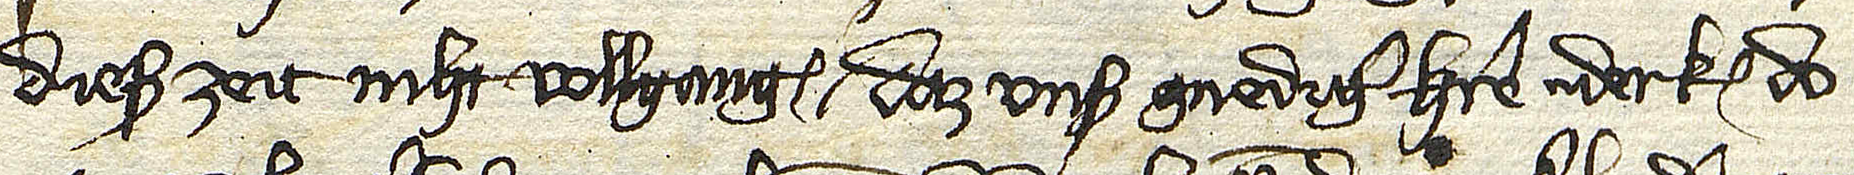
dieſ* ʒeit niht vollgang* / daʒ vnſ* gnedig* h*re ~ der k* do
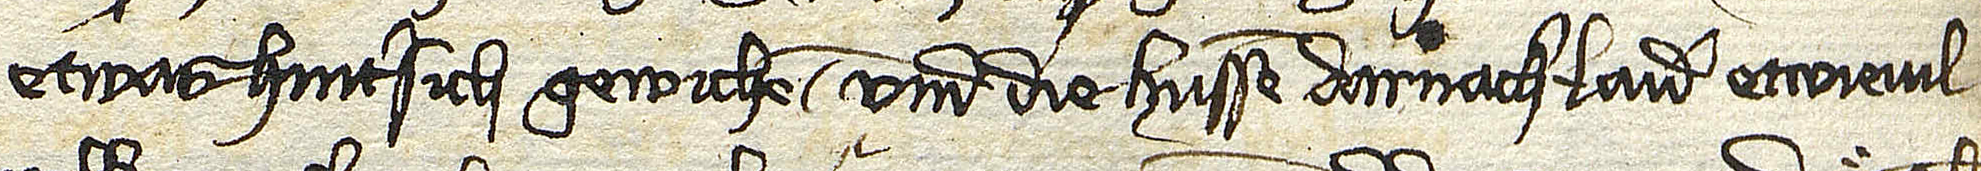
etwas hint* ſich gewiche* / vnd die huſſe darnach laid* etwieuil
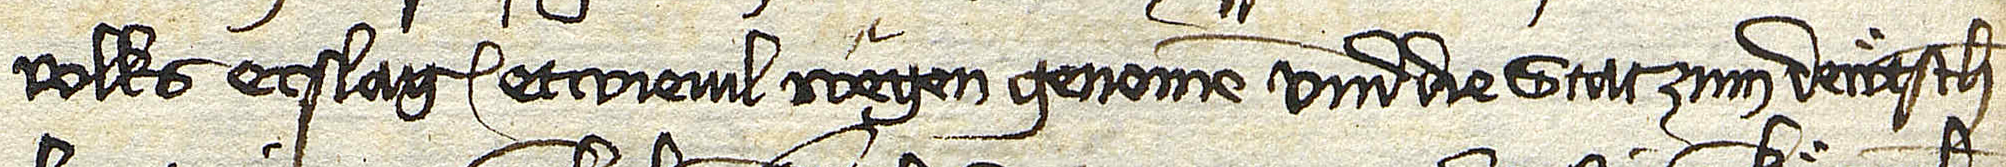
volks erſlag* etwieuil wëgen genome* vnd die Stat ʒum dewtſch*
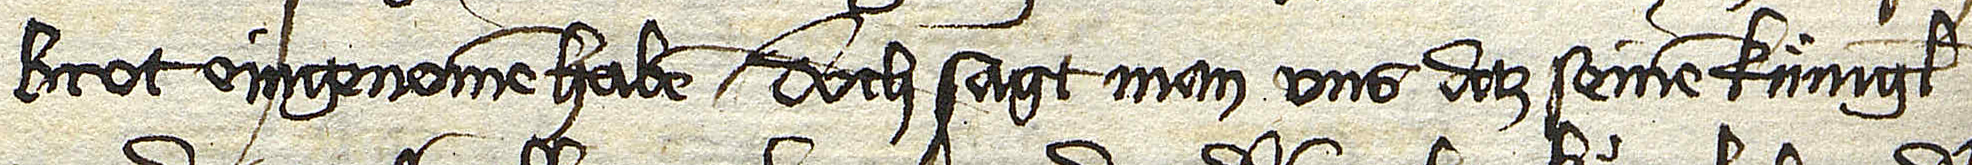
brot eingenome* habe* / Doch ſagt man vns daʒ ſeine* künigl*
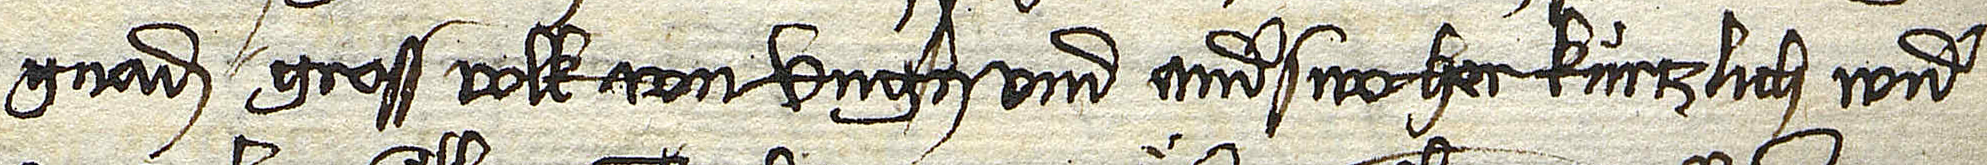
gnad* groſſ volk von Vng*n vnd and*ſwoher kürcʒlich wid*
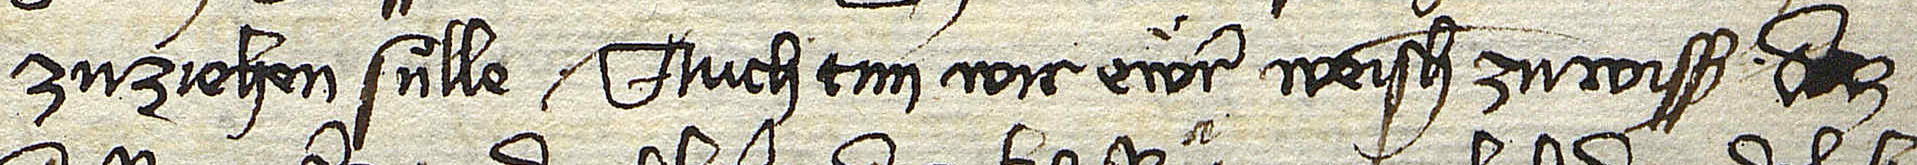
ʒuʒiehen ſülle / Auch tun wir ew*r weiſh* ʒuwiſſ* . daʒ
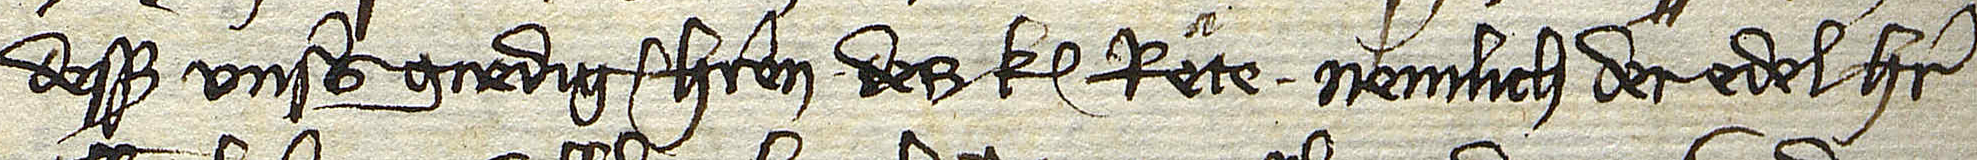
deſſ* vnſ*s gnedig* h*ren . des k* Rëte . nemlich der edel h*r
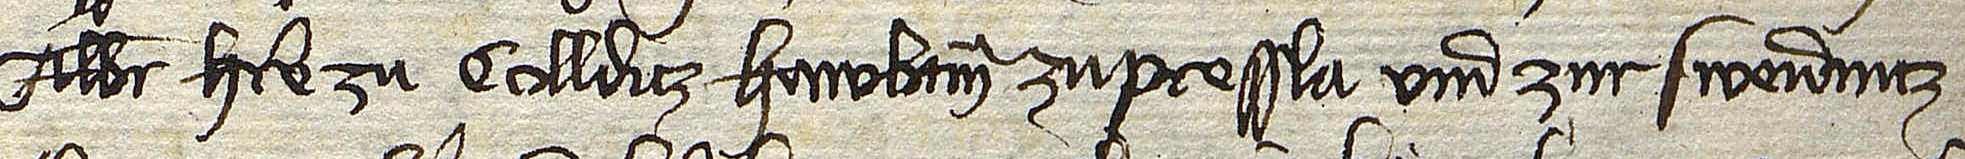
Albr* h*re ʒu Colldicʒ hawbtm* ʒu preſſla vnd ʒur ſweidnicʒ
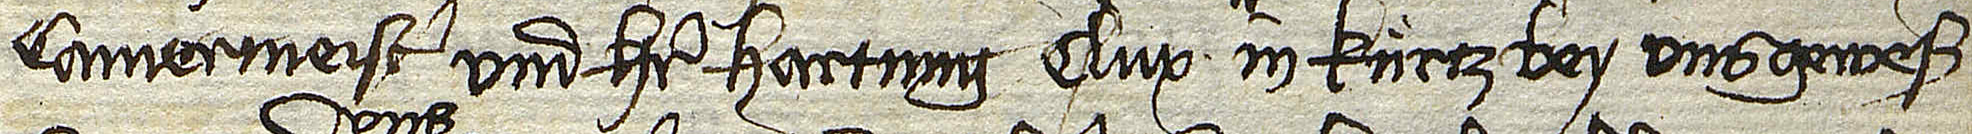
Camermeiſt* vnd h*r hartung Clux in kürcʒ bey vns geweſ*
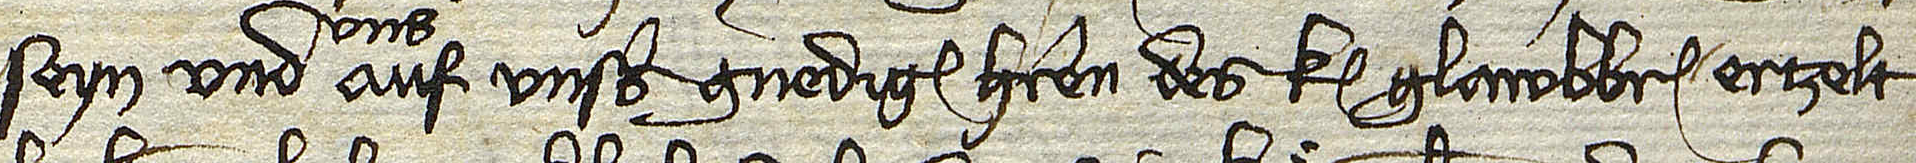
ſeyn vnd auf vnſ*s gnedig* h*ren des k* glawbbr* ercʒelt
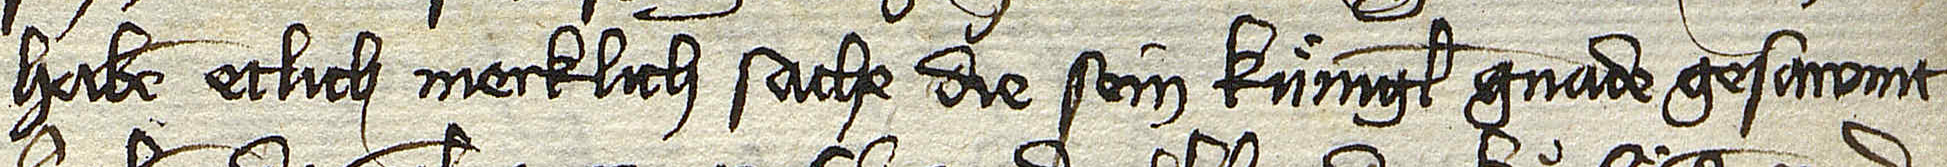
habe* etlich merklich ſache die ſein künigl* gnade geſawmt
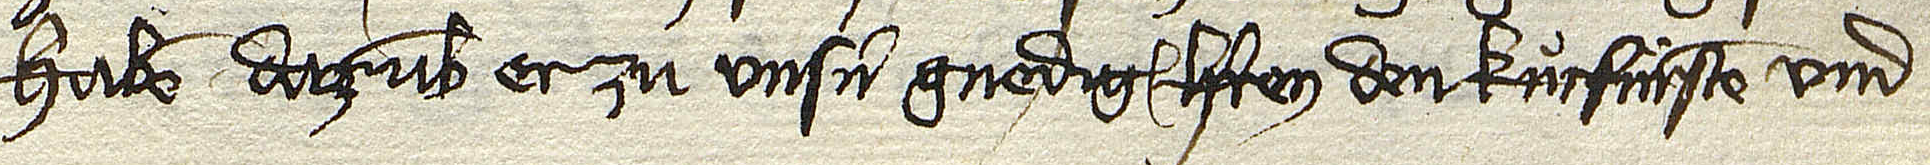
habe* daru*b er ʒu vnſ*n gnedig* h*ren den kürfürſte* vnd
